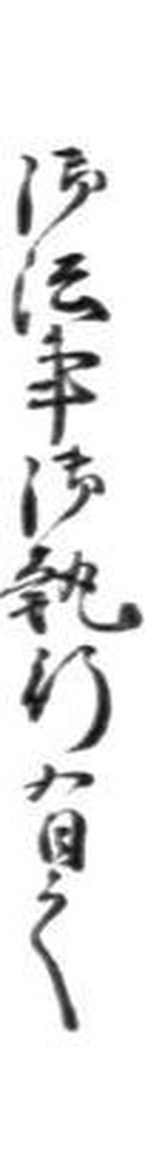御法事御執行有之
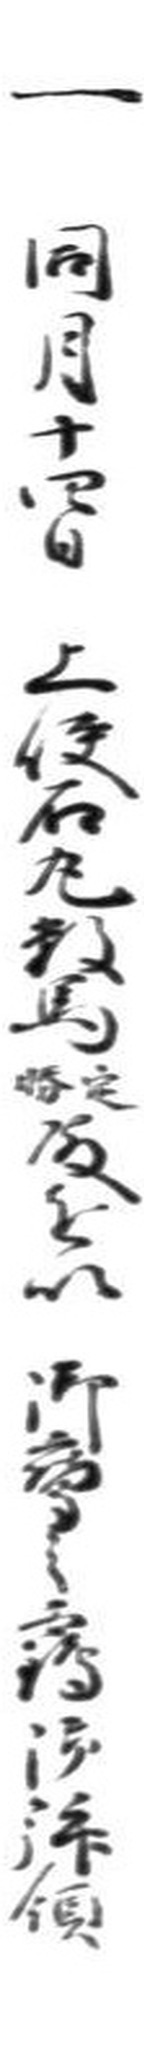一同月十四日上使石丸数馬定勝殿を以御鷹之鶴御拝領
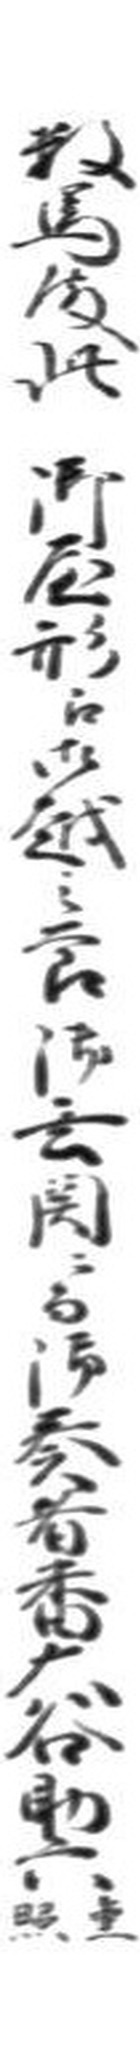数馬殿此御屋形江御越之節御玄関ニ而御奏者番大谷助六重照
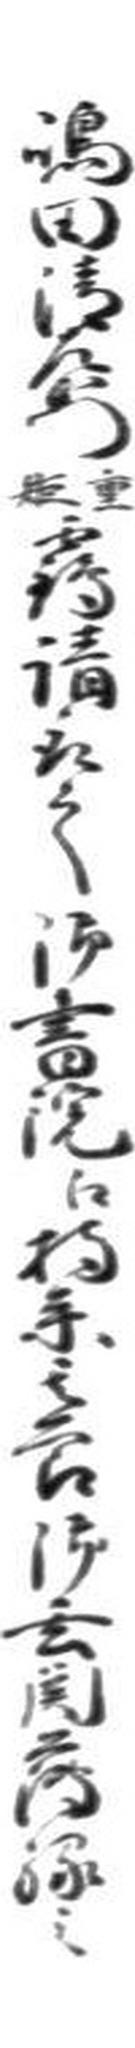嶋田清左衛門重矩鶴請取之御書院江持参之節御玄関薄縁之
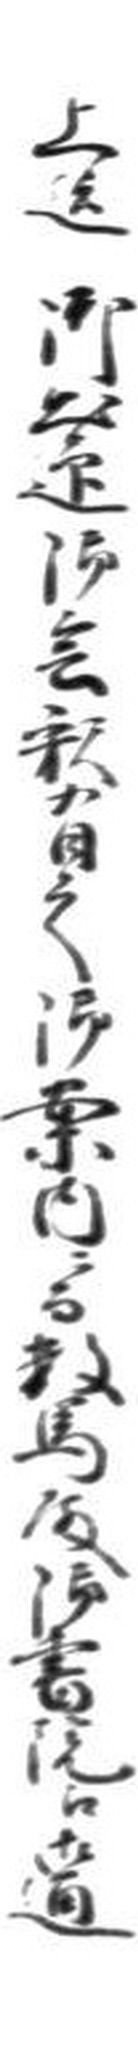上迄御出迎御会釈有之御案内ニ而数馬殿御書院江御通
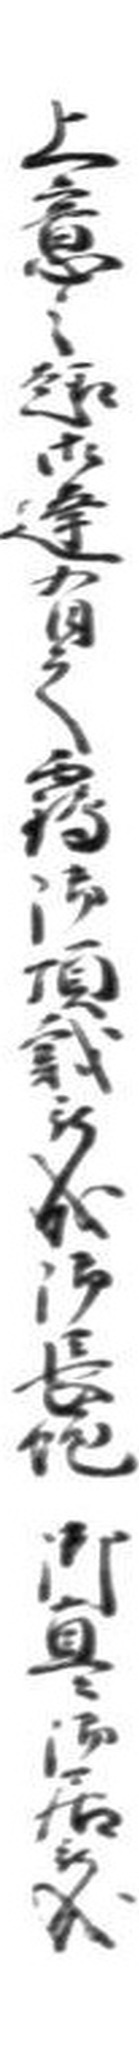上意之趣御達有之鶴御頂戴被成御長蚫御直ニ御居被成
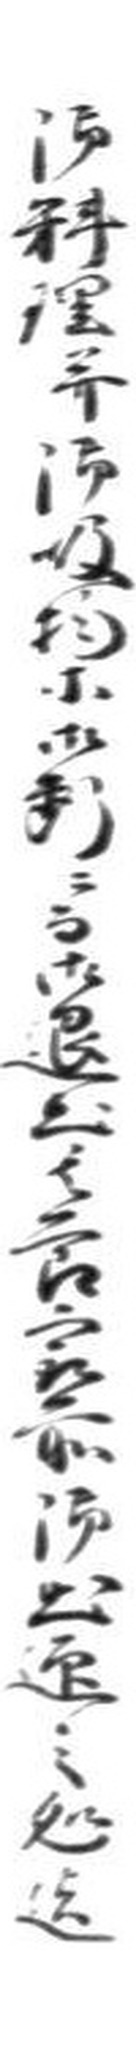御料理并御吸物等御断ニ而御退出其節最前御出迎之処迄
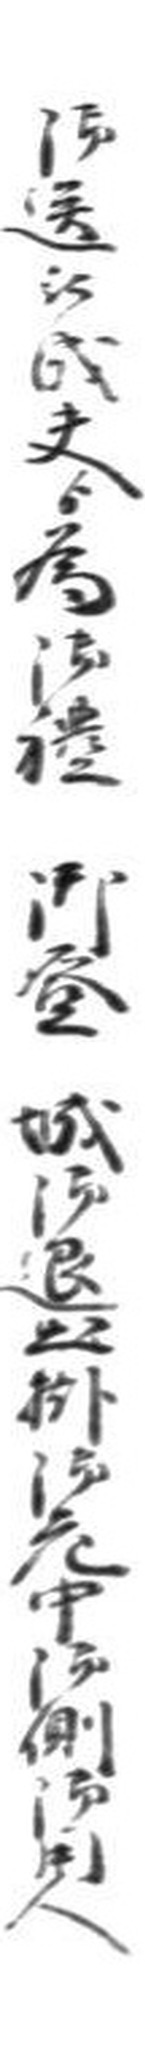御送被成夫ゟ為御礼御登城御退出掛御老中御側御用人

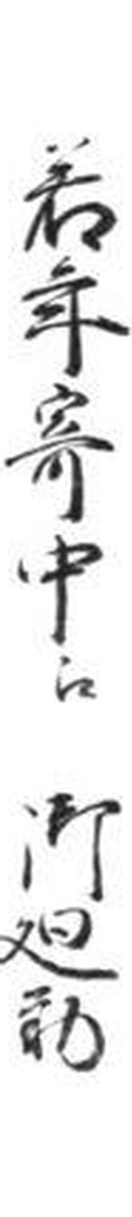若年寄中御廻勤
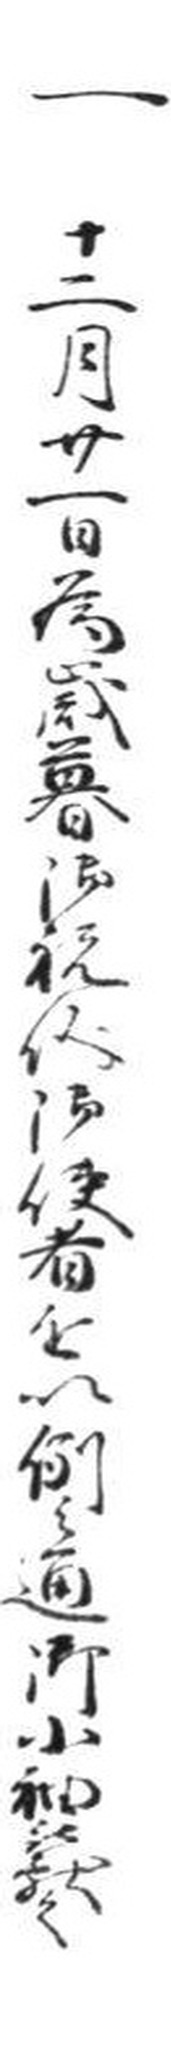一十二月廿一日為歳暮御祝儀御使者を以例之通御小袖被献之
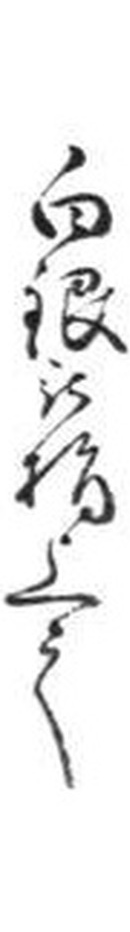白銀被指上之
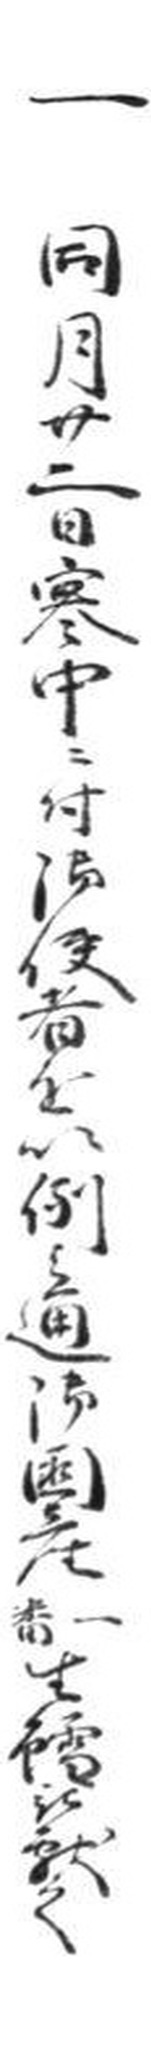一同月廿二日寒中ニ付御使者を以例之通御国産一番生鱈被献之
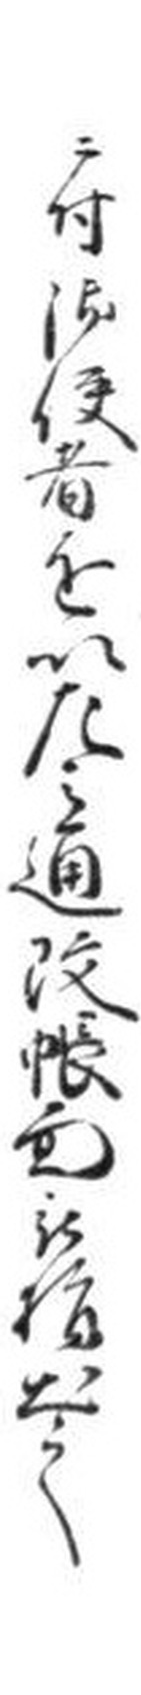ニ付御使者を以左之通改帳面被指出之
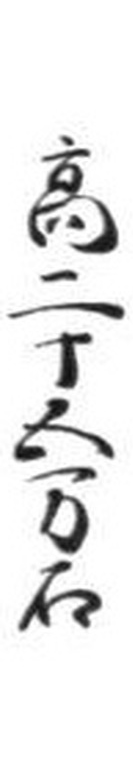高二十五万石
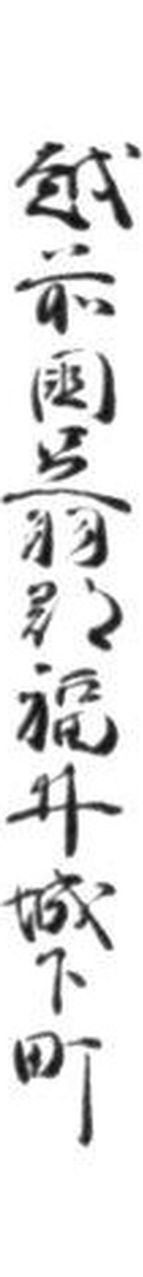越前国足羽郡福井城下町

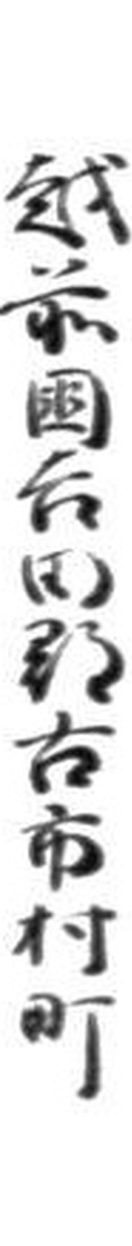越前国吉田郡古市村町
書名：家譜 十七 吉品公 従元禄元年到同二年
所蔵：福井県文書館 Fukui Prefectural Archives
